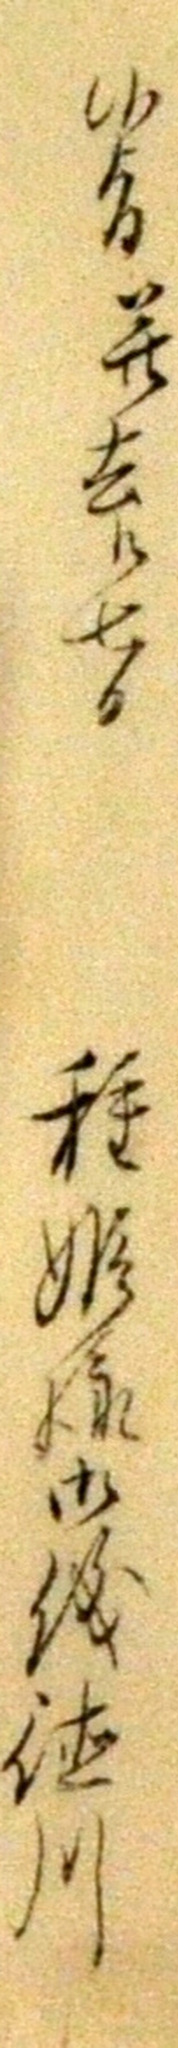候旨并去ル七日種姫様御儀徳川
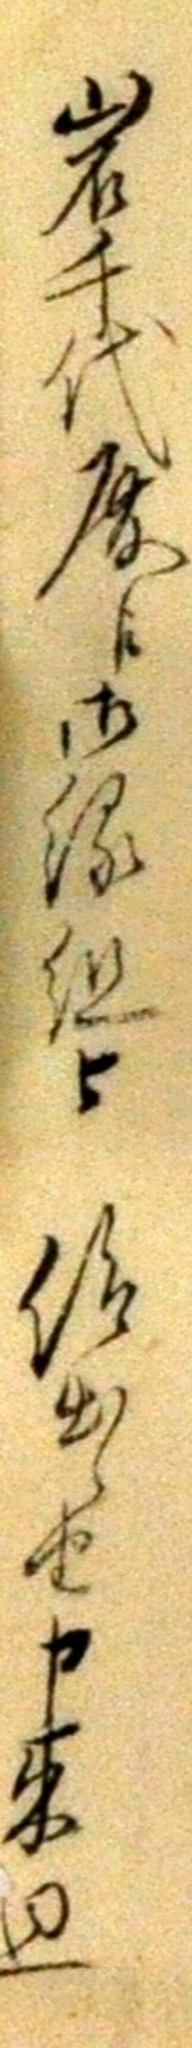岩千代殿え御縁組被仰出候由申来且

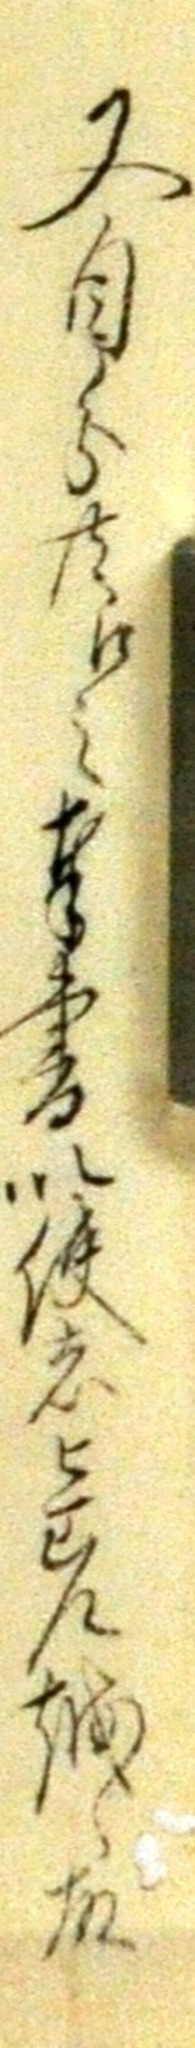又自分共え之奉書以使者被差越候故
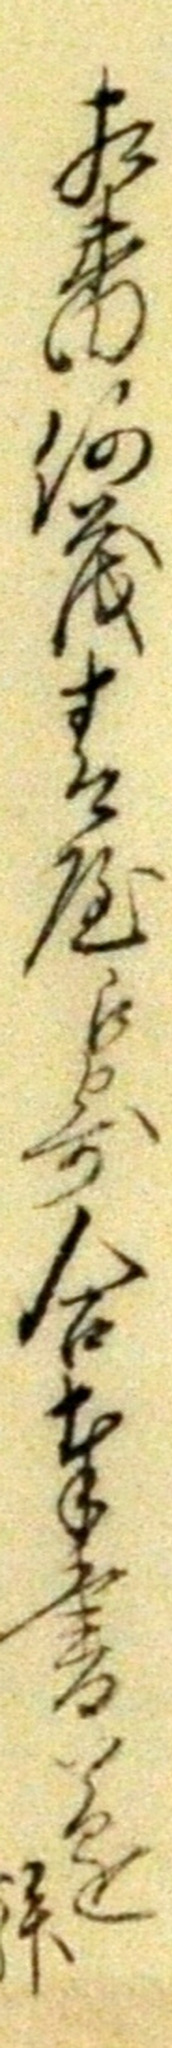相番何も青屋え寄合奉書遂拝
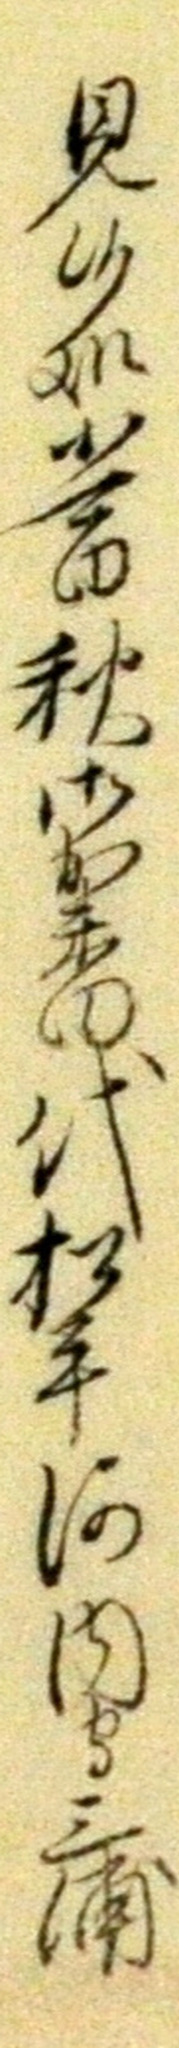見候処当秋御加番代松平河内守三浦
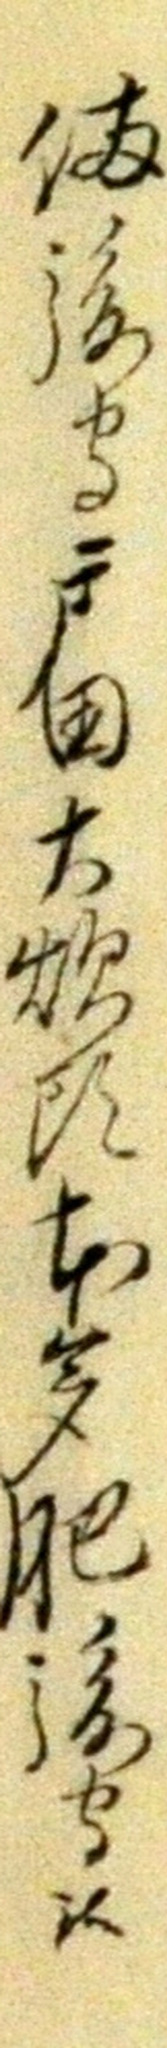備後守戸田大炊頭本多肥後守被
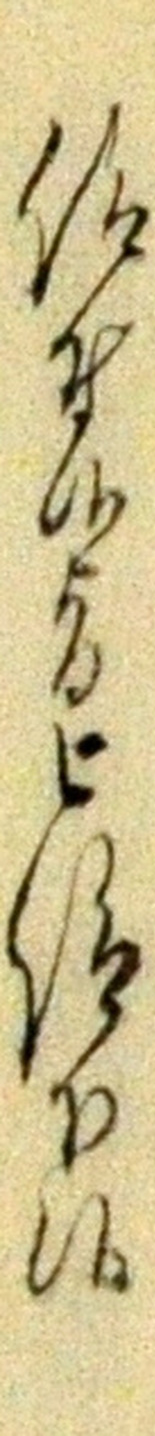仰付候旨被仰下候
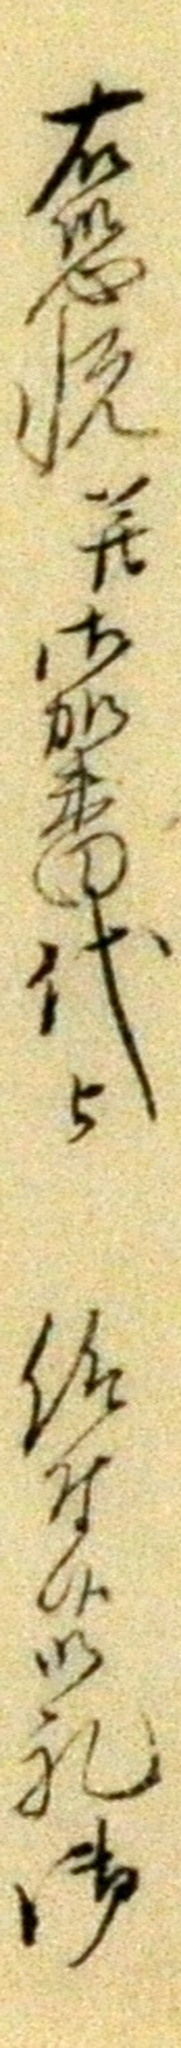右恐悦并御加番代被仰付候御礼御
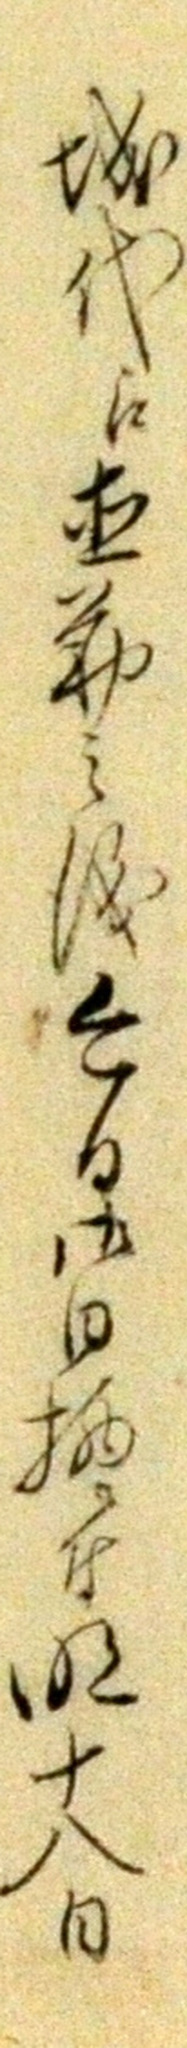城代え直勤之儀今日御日柄ニ付明十八日
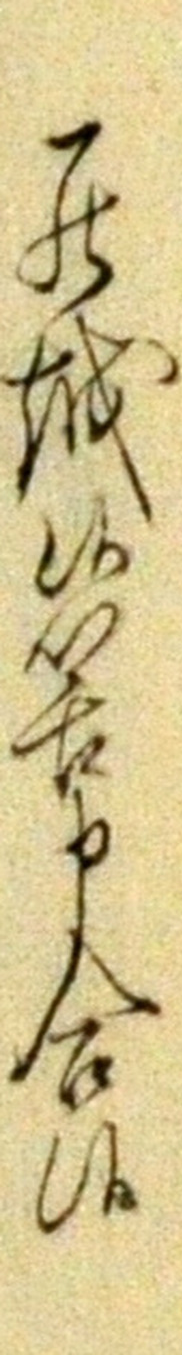罷越候筈申合候
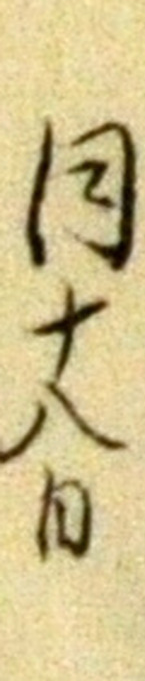同十八日
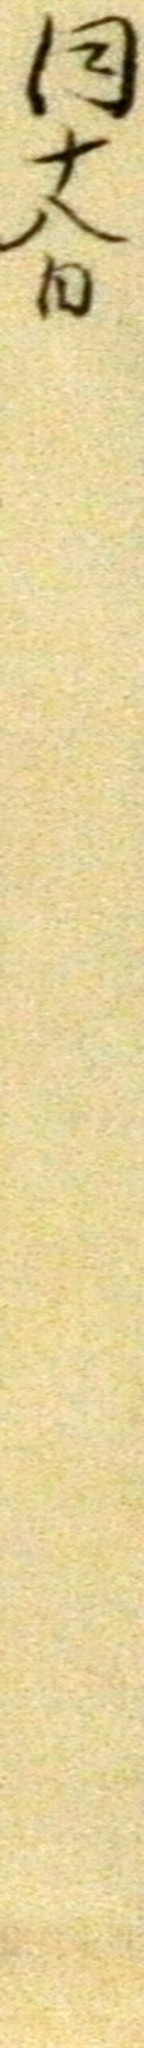同十八日
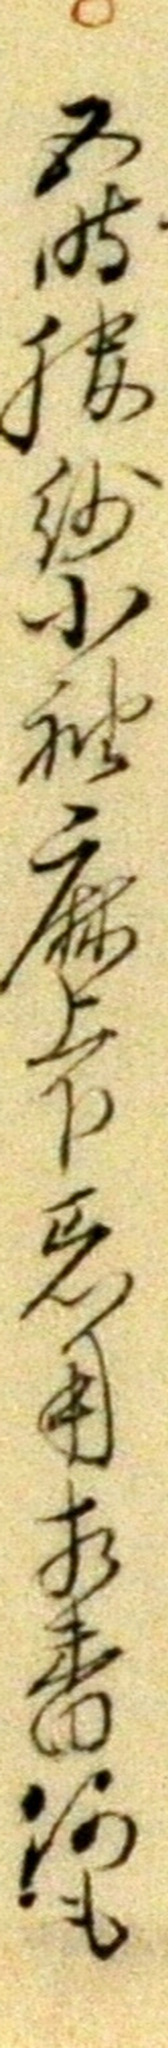五時服紗小袖麻上下着用相番何も
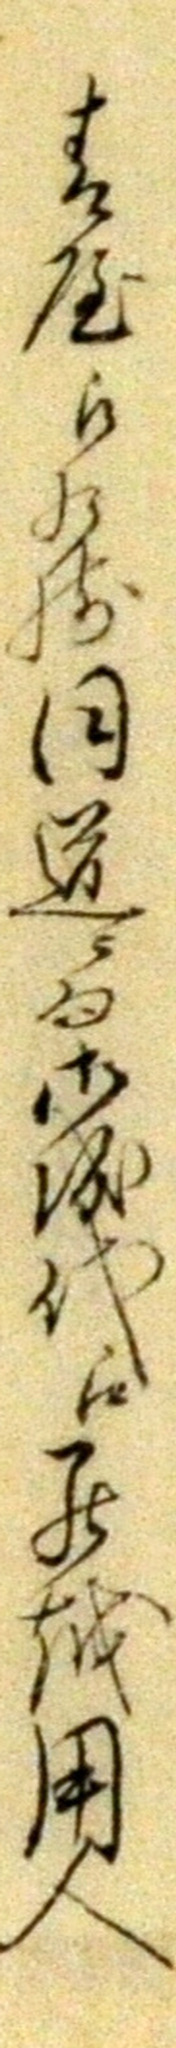青屋え相揃同道ニ而御城代え罷越用人
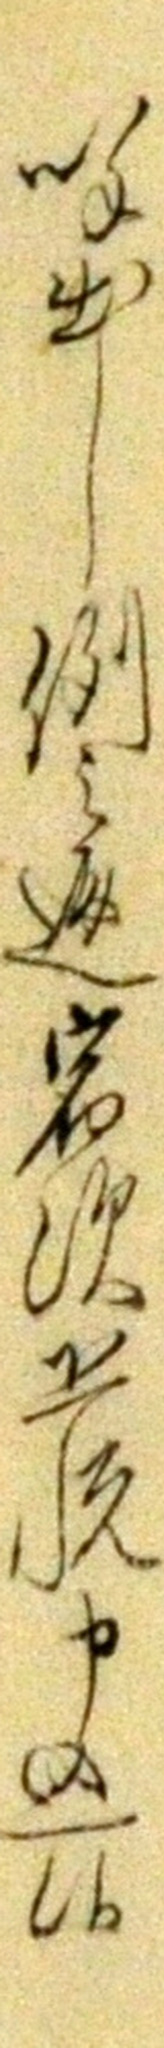呼出し例之通宿次恐悦申込候
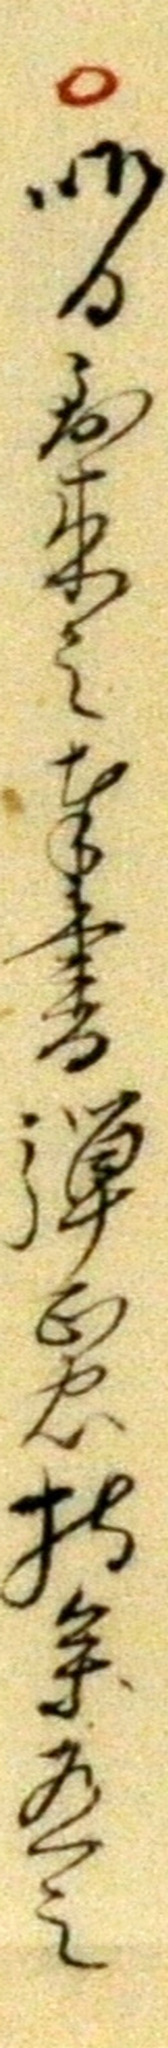昨日到来之奉書弾正忠持参有之
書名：大阪加番関係諸書留〔一括〕
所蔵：伊那市立高遠町図書館・合同会社AMANE
